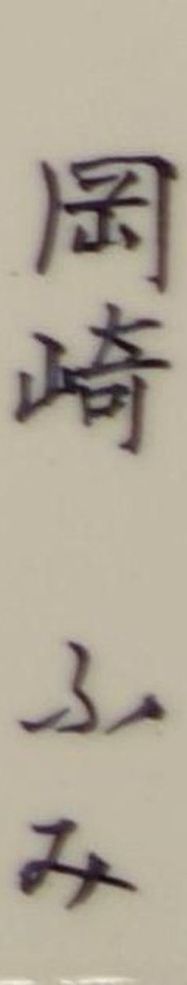岡崎ふみ
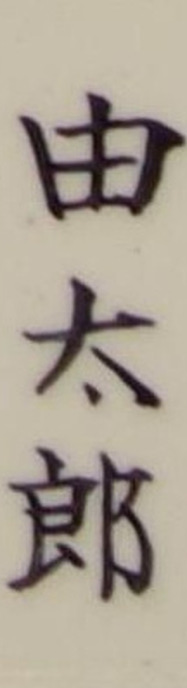由太郎
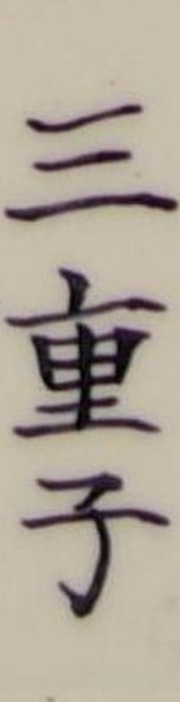三重子
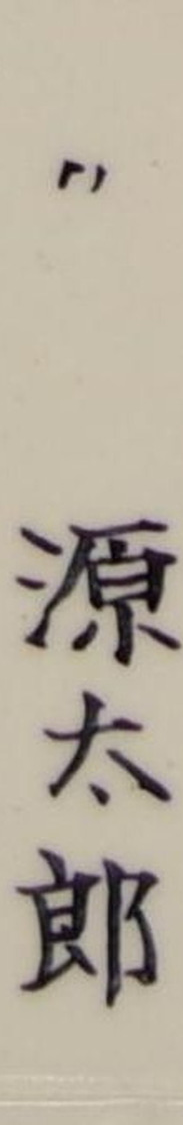源太郎
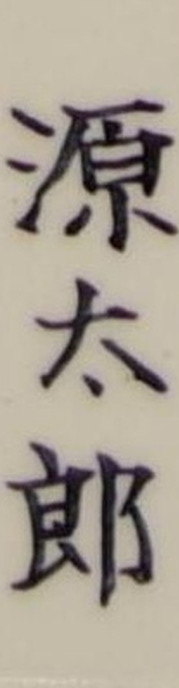源太郎
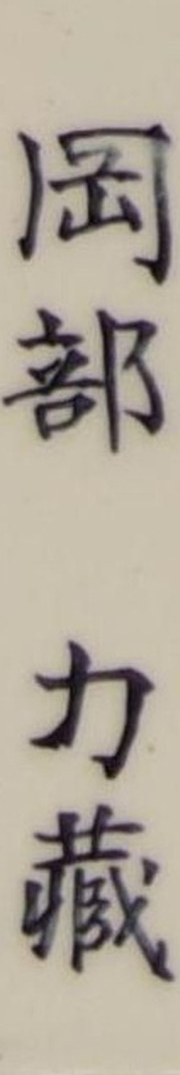岡部力蔵
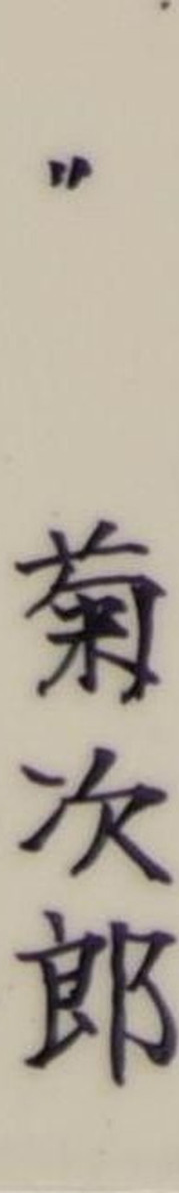菊次郎
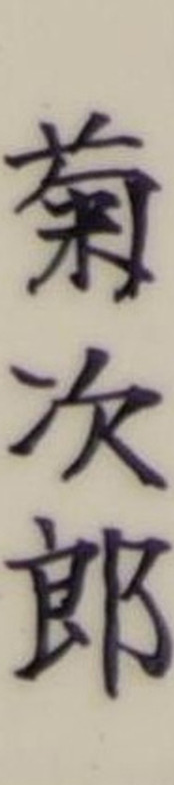菊次郎
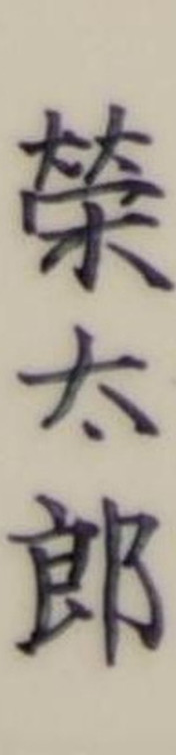榮太郎

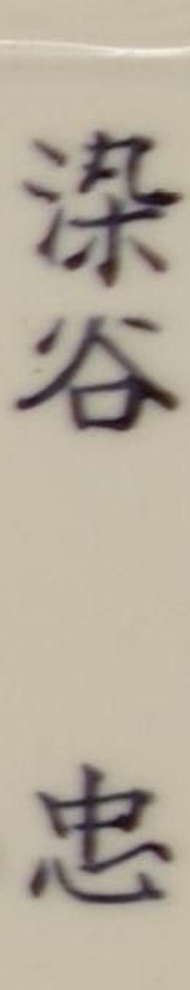染谷忠
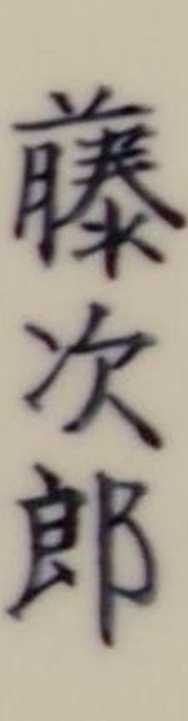藤次郎
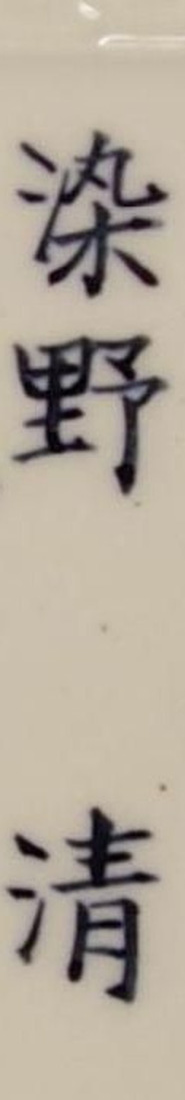染野清
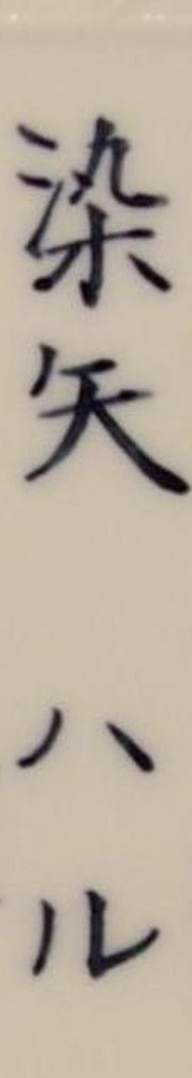染矢ハル
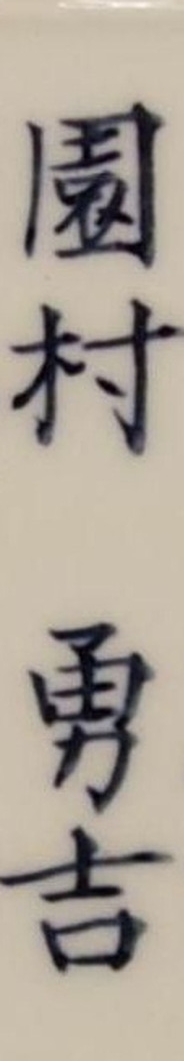園村勇吉
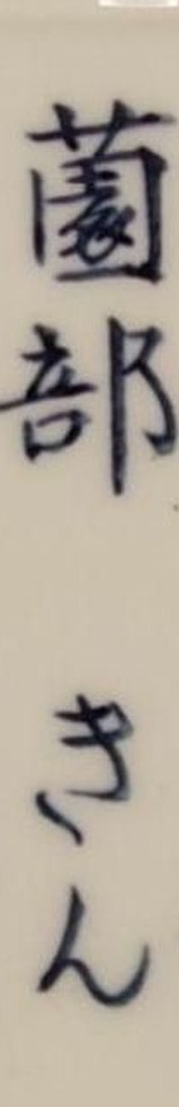菌部きん
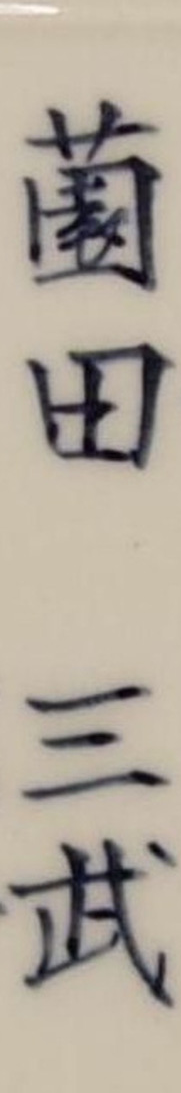蘭田三武
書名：E~L
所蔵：高野山金剛峯寺
